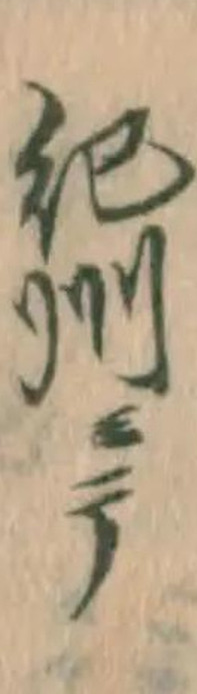紀州ニテ
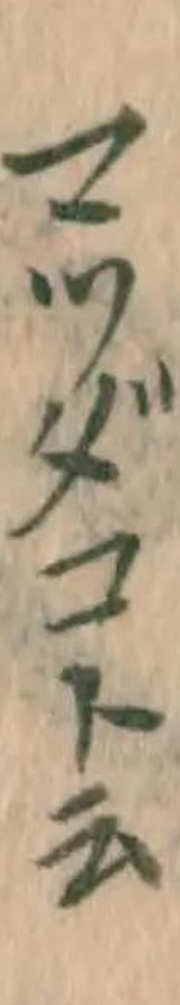マツダコト云
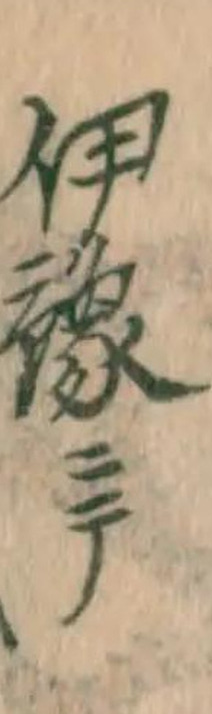伊豫ニテ
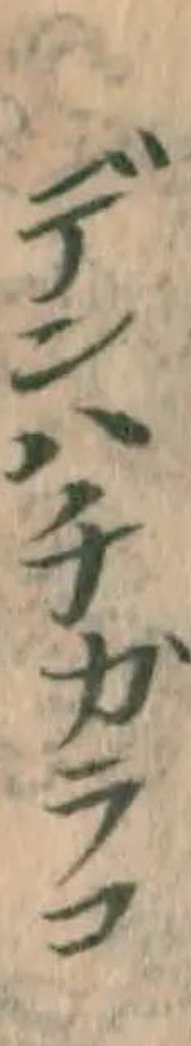デンハチガラコ
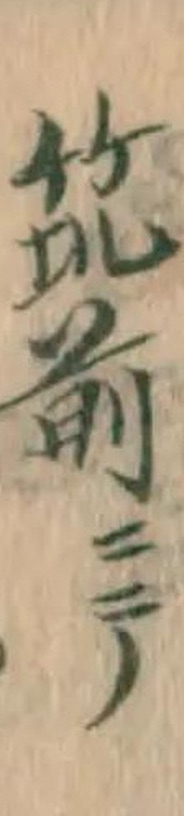筑前ニテ
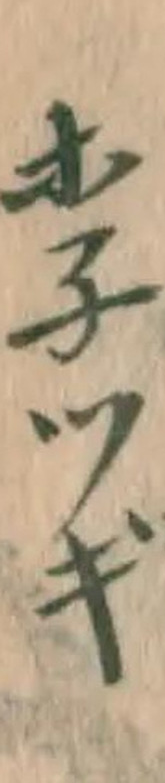ホネツギ
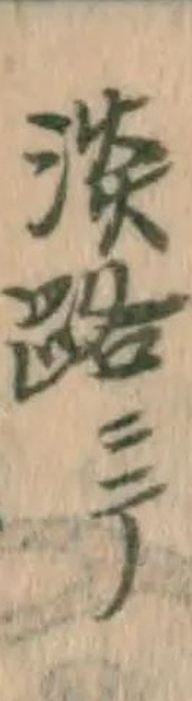淡路ニテ
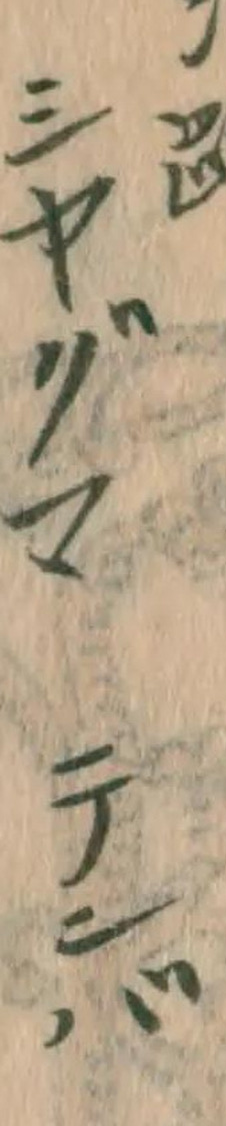シヤグマテンバ
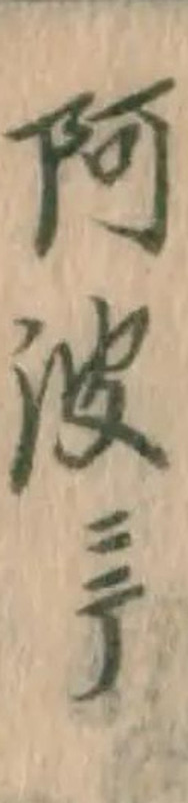阿波ニテ
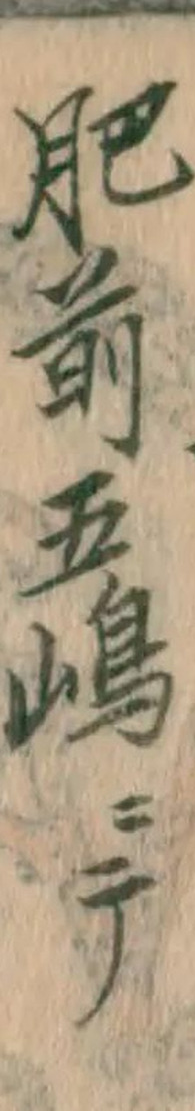肥前五嶋ニテ
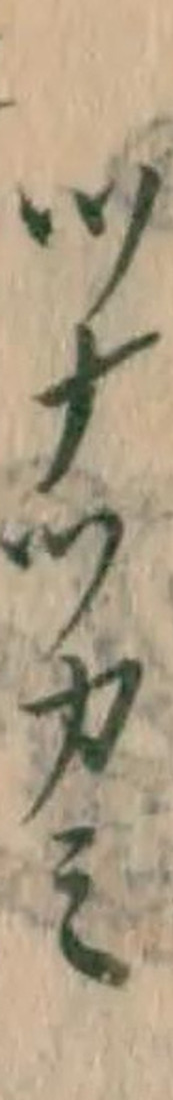ツナツカミ
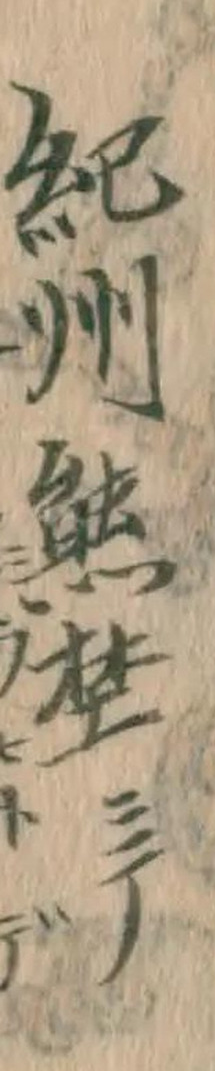紀州熊埜ニテ
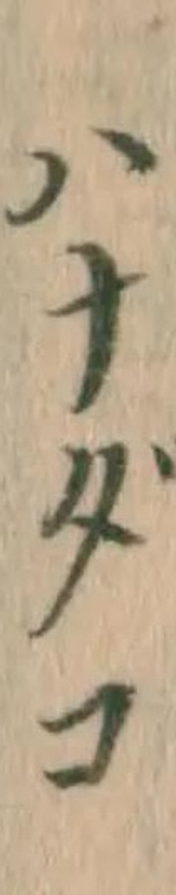ハナダコ
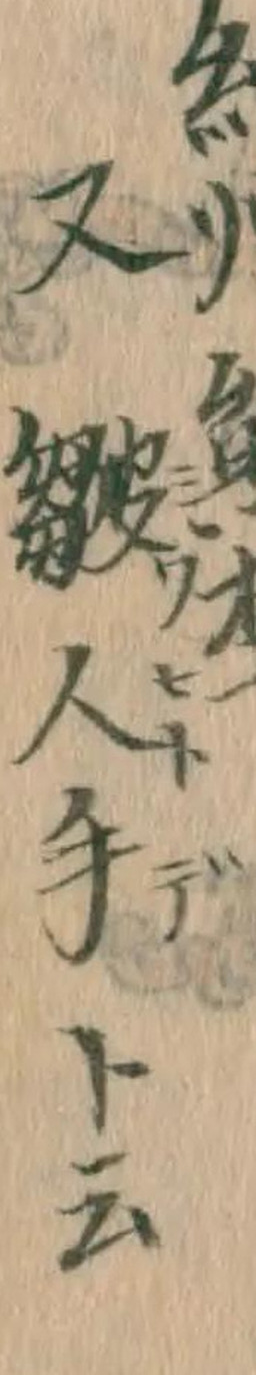又皺人手ト云
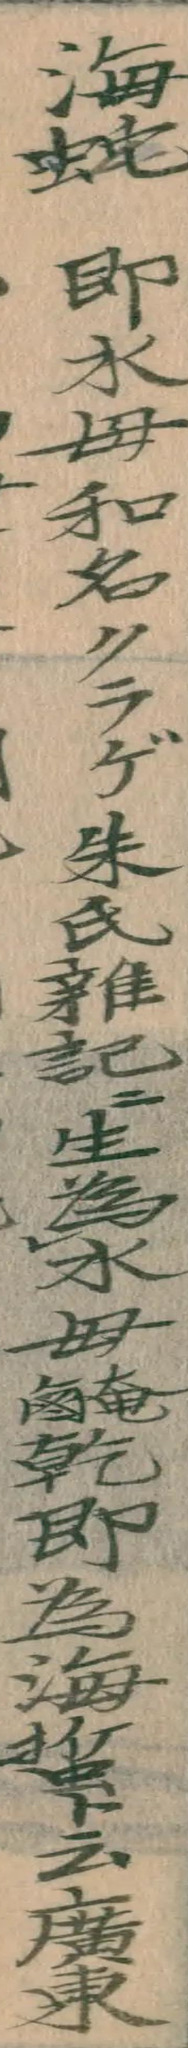海䖳即水母和名クラゲ朱氏雑記ニ生為水母乾即為海蜇ト云廣東
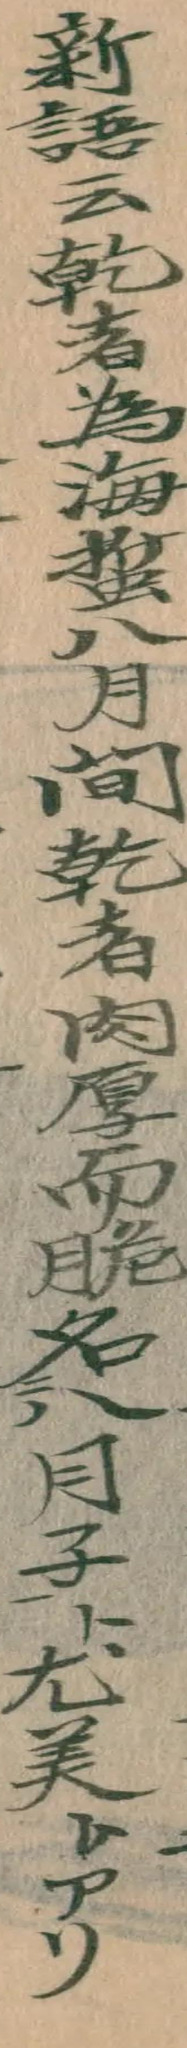新語云乾者為海蜇八月間乾者肉厚而脆名八月子ト尤美トアリ
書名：千蟲譜 3巻. [1]
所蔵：国立国会図書館 National Diet Library, JAPAN
